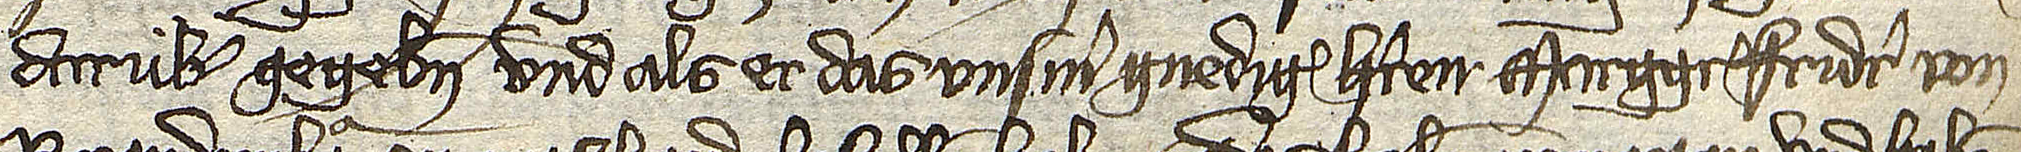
darüb* gegebn* vnd als er das vnſm* gnedig* h*ren . Marggr* Fridr* von
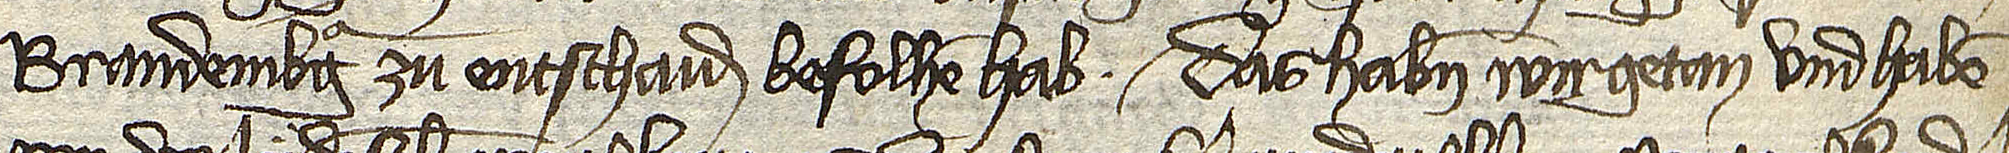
Brandemb*g ʒu entſchaid* befolhe* hab . / Das habn* wir getan vnd habe*
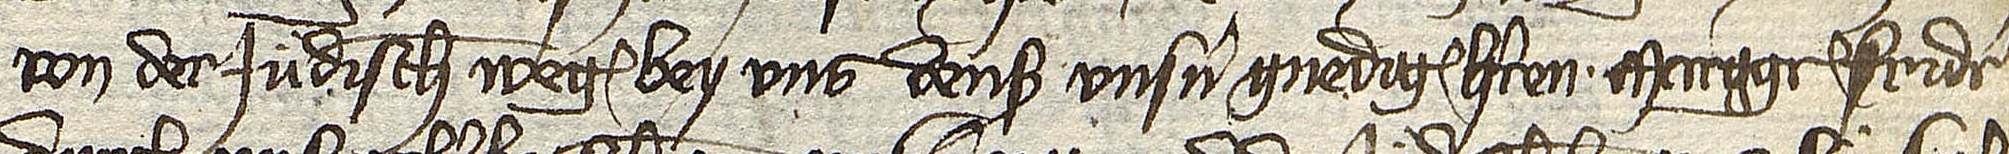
von der Iüdiſch* weg* bey vns denſ* vnſn* gnedig* h*ren . Marggr* Fridr*
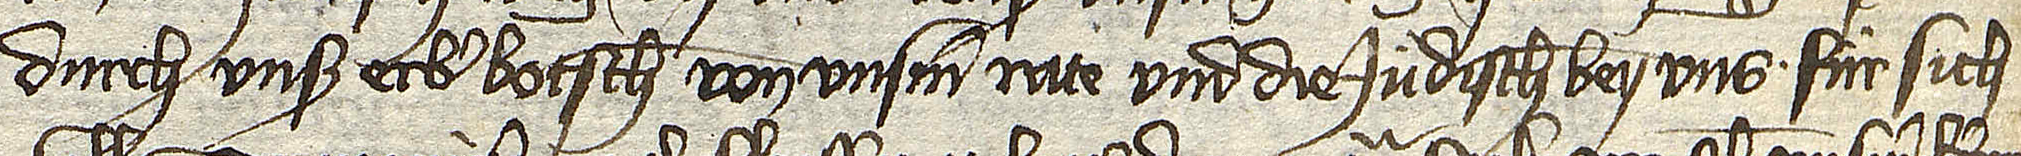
durch vnſ* erb* botſch* von vnſm* rate vnd die Iüdiſch* bey vns . für ſich
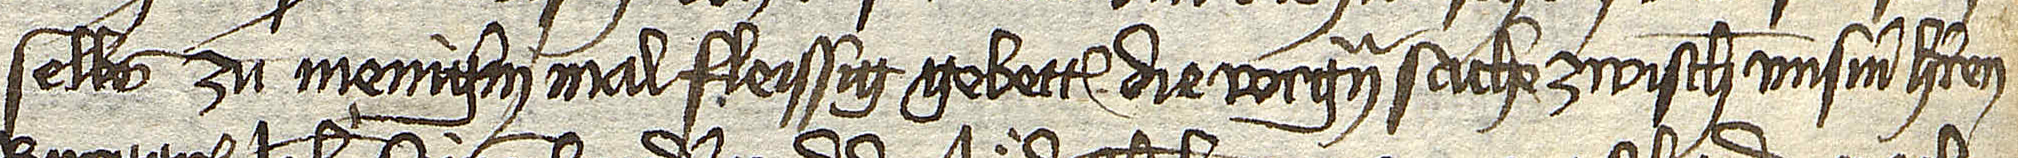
ſelbs ʒu menig*m mal fleiſſig gebett* . die vorgn* ſache ʒwiſch* vnſm* h*ren
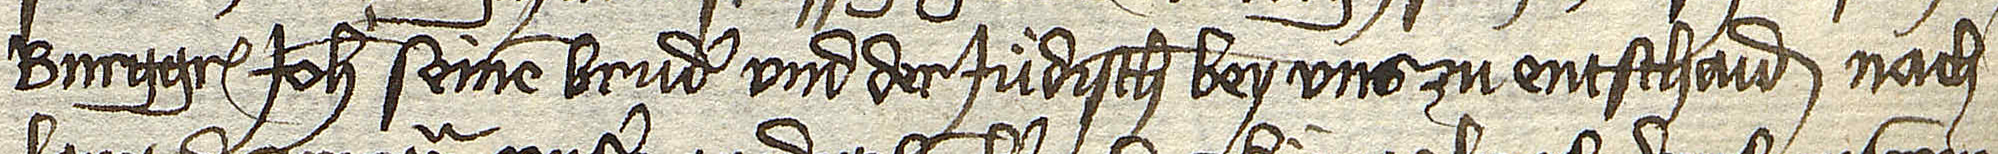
Burggr* Ioh* ſeine* brud* vnd der Iüdiſch* bey vns ʒu entſchaid* nach
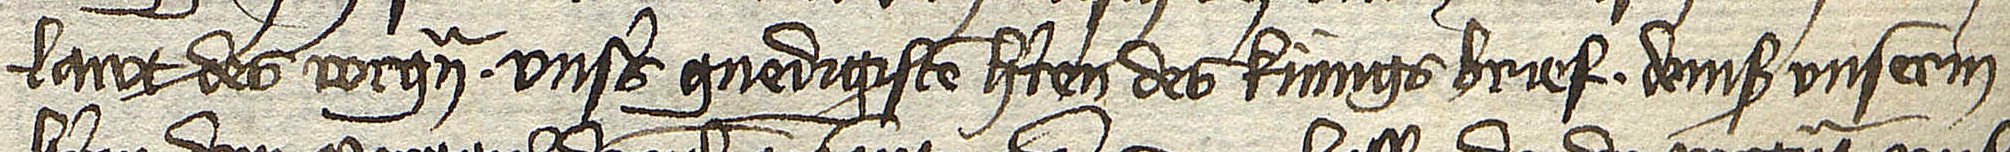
lawt des vorgn* . vnſ*s gnedigiſte* h*ren des künigs brief . demſ* vnſerm
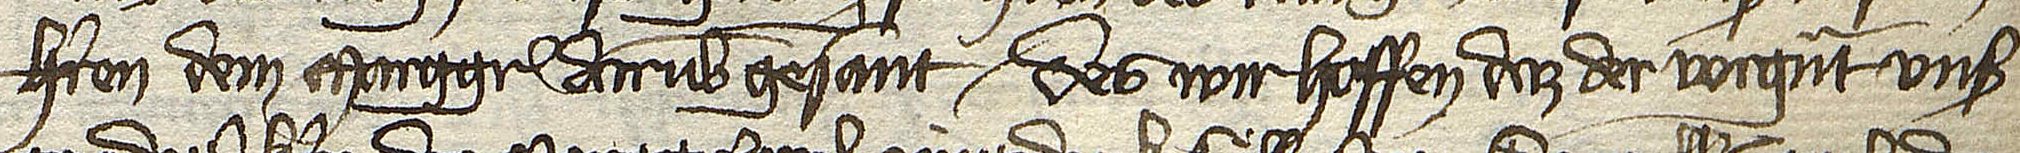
h*ren dem Marggr* darub* geſant / Des wir hoffen daʒ der vorgnt* vnſ*
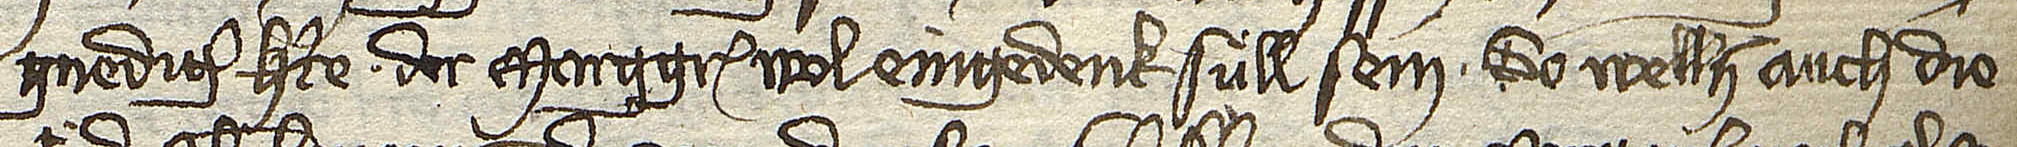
gnedig* h*re . der Marggr* wol eingedenk ſüll ſein . So welln* auch die
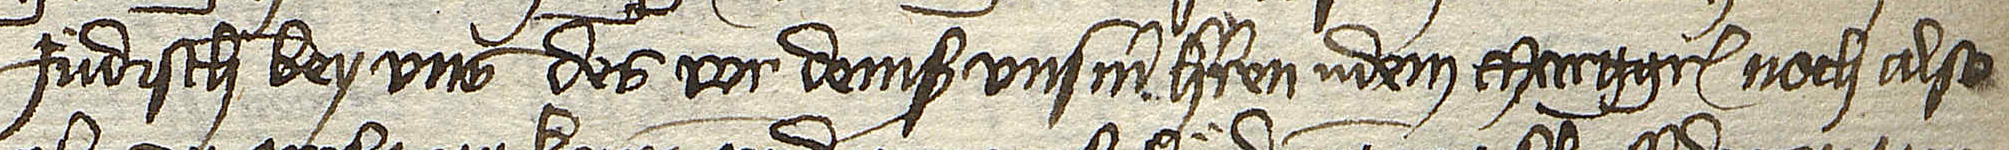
Iüdiſch* bey vns des vor demſ* vnſm* h*ren ~ dem Marggr* noch alſo
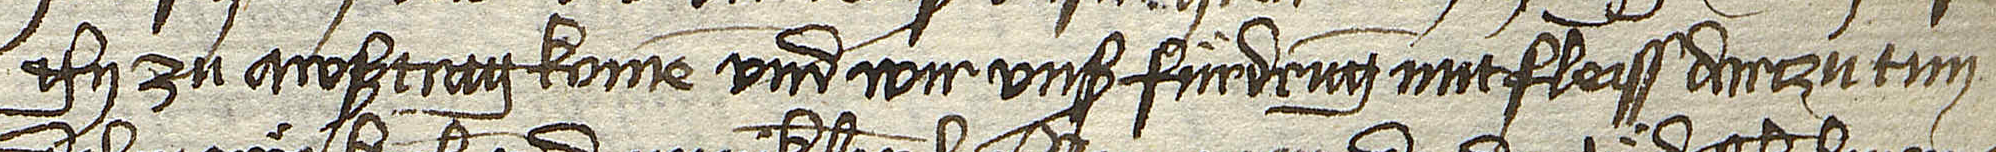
g*n ʒu awſʒtrag kome* vnd wir vnſ* fürdru*g mit fleiſſ darcʒu tun
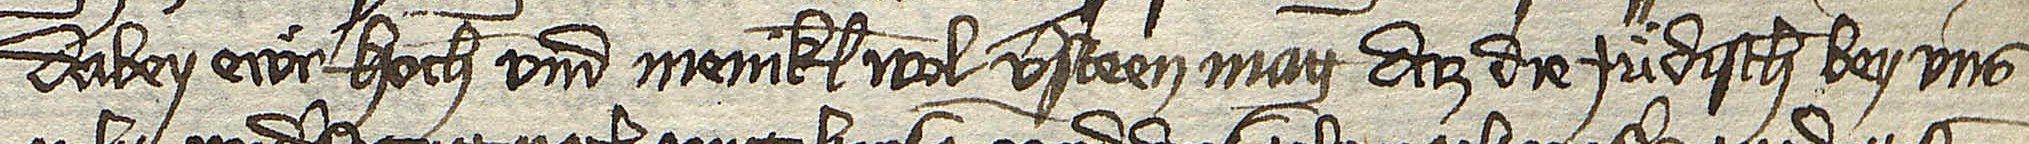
Dabey eẅr hoch* vnd menikl* wol v*ſteen mag daʒ die Iüdiſch* bey vns
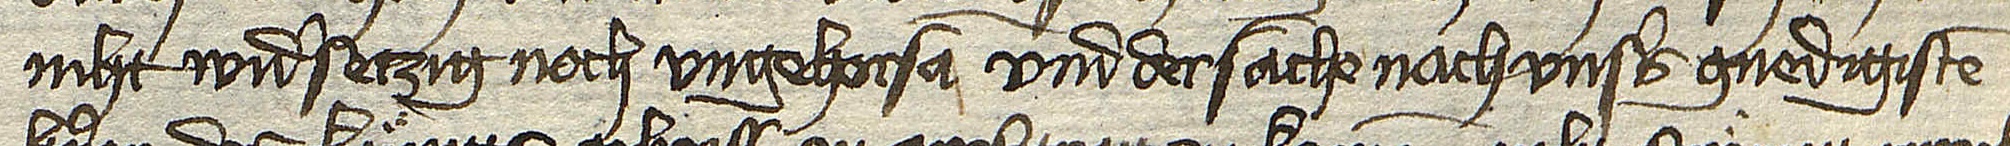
niht wid*ſecʒig noch vngehorſa* vnd der ſache nach vnſ*s gnedigiſte*
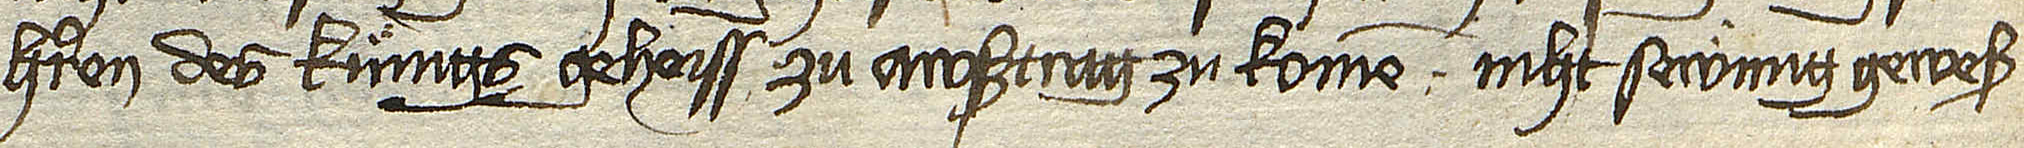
h*ren des künigs geheiſſ ʒu awſʒtrag ʒu kome* . niht ſeẅmig geweſ*
